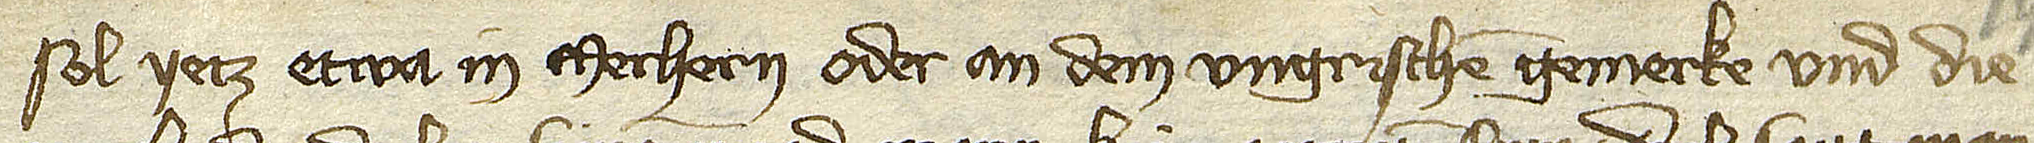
ſol yecʒ etwa in Merhern oder an dem vngriſche* gemerke vnd die
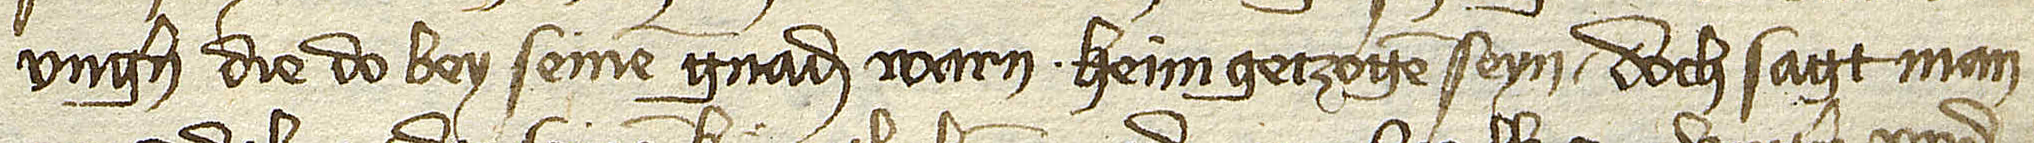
vng*n die do bey ſeine* gnad* warn . heim gecʒoge* ſeyn / Doch ſagt man
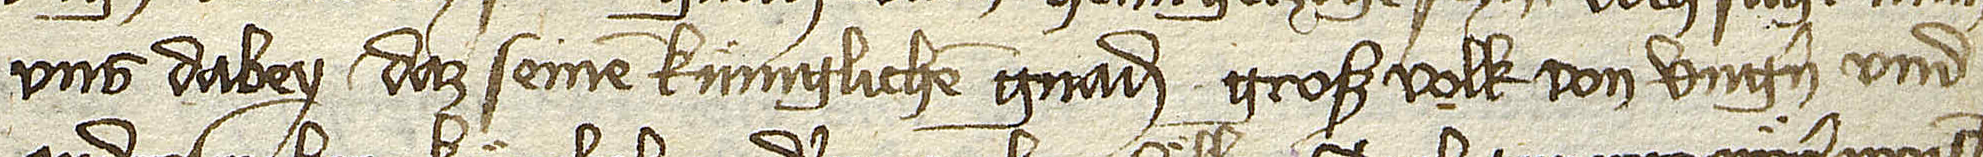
vns dabey / daʒ ſeine* künigliche* gnad* groſʒ volk von Vng*n vnd
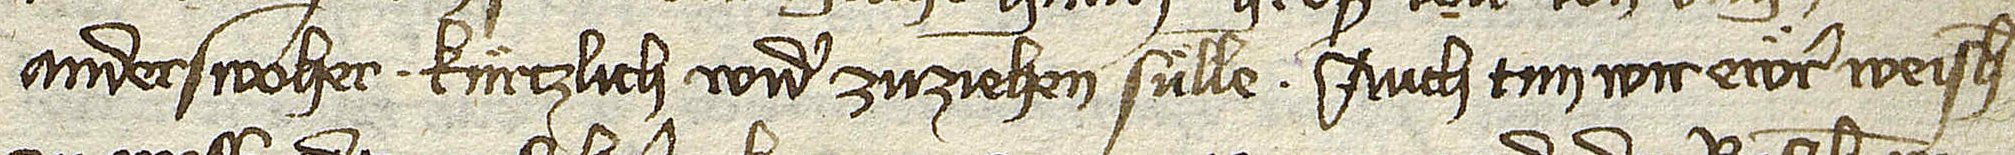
anderſwoher . kürcʒlich wid* ʒuʒiehen ſülle. Auch tun wir ew*r weiſh*
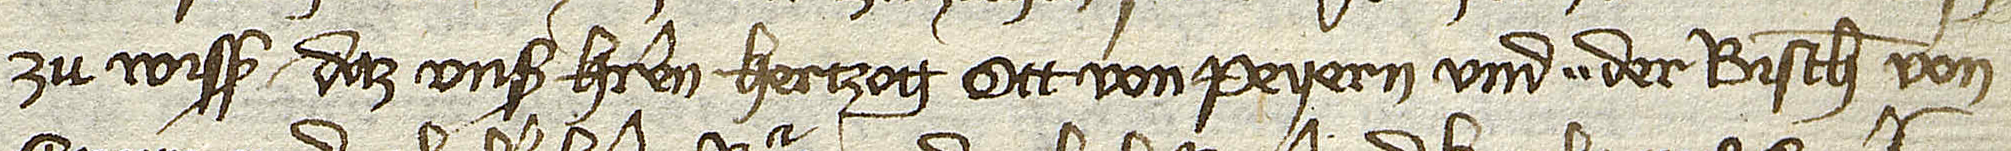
ʒu wiſſ* / daʒ vnſ* h*ren hercʒog Ott von Peyern vnd ~ der Biſch* von
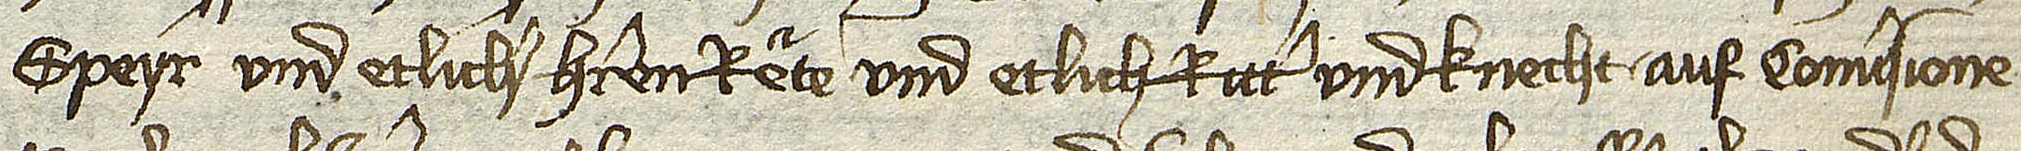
Speyr vnd etlich* h*ren Rëte vnd etlich Ritt* vnd knecht / auf Conu*ſione
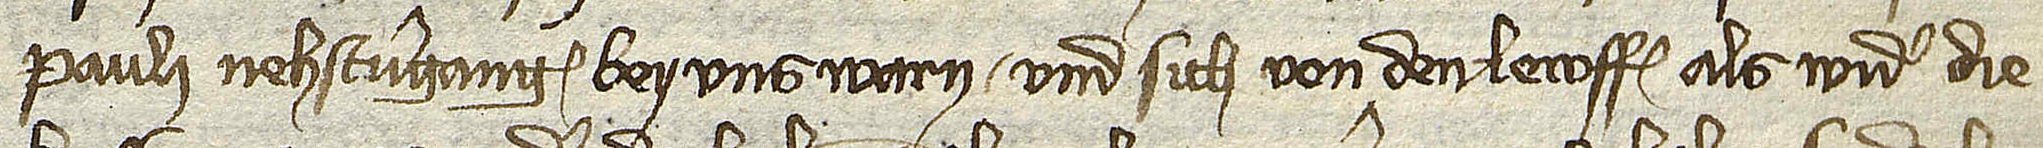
Pauli nehſtu*gang* bey vns warn / vnd ſich von den lewff* als wid* die
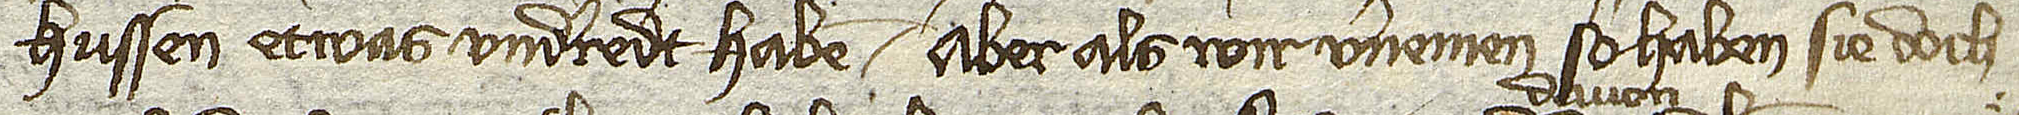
huſſen etwas vnd*redt habe* / Aber als wir v*nemen ſo haben ſie doch
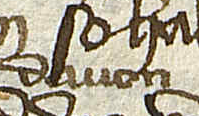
dauon
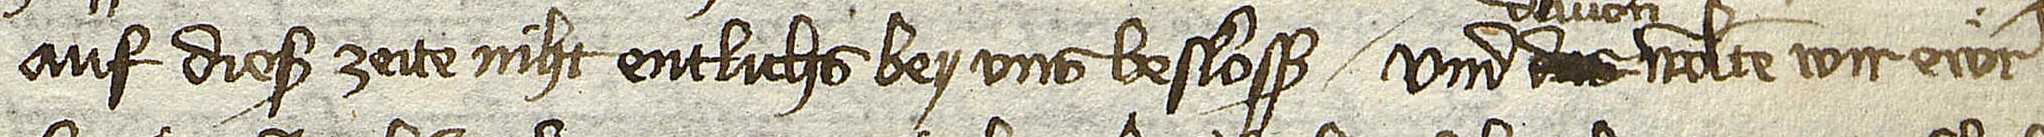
auf dieſ* ʒeite niht entlichs bey vns beſloſſ* / Vnd das wolte* wir ew*r
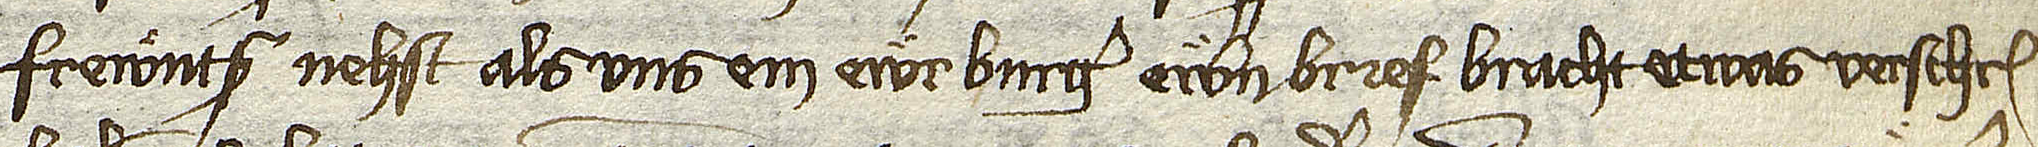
frewntſ* nehſt als vns ein ewr burg* ew*n brief bracht etwas verſchr*
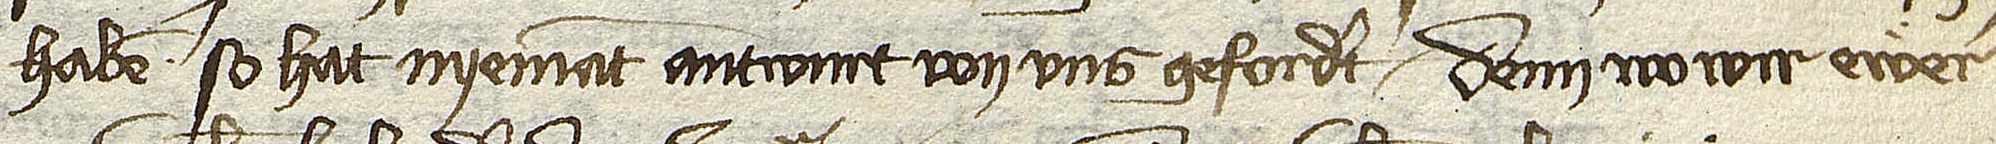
habe* . ſo hat nyema*t antwurt von vns geford*t / Denn wo wir ewer*
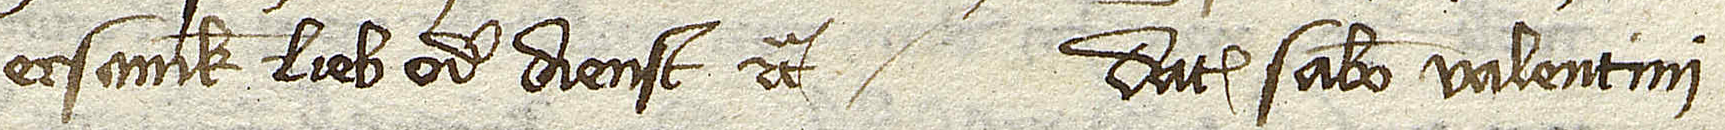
erſamk* lieb od* dienſt ec* / Dat* ſabo* valentini
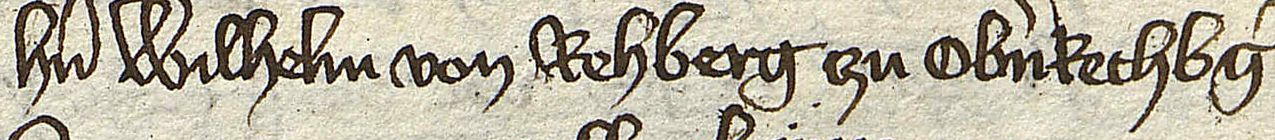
H*n Wilhelm von Rehberg cʒu Obn* Rechb*g
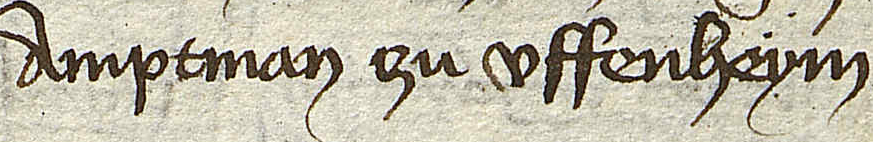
Amptman cʒu vffenheym
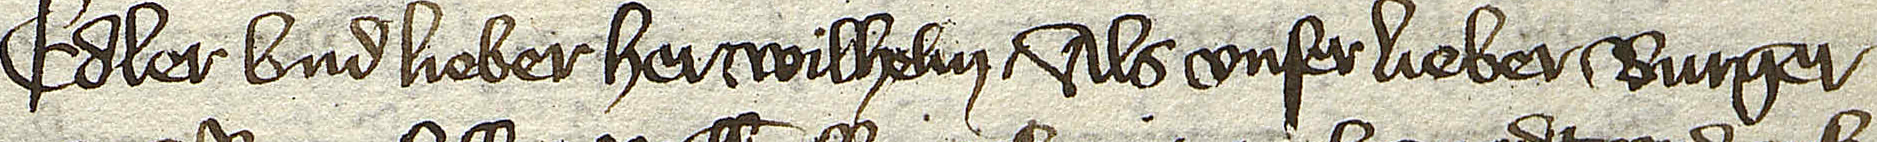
Edler vnd lieber her wilhelm / Als vnſer lieber Burger
